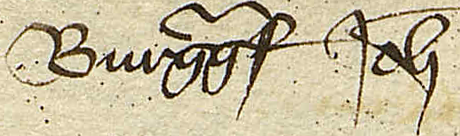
Burgg*f Ioh*
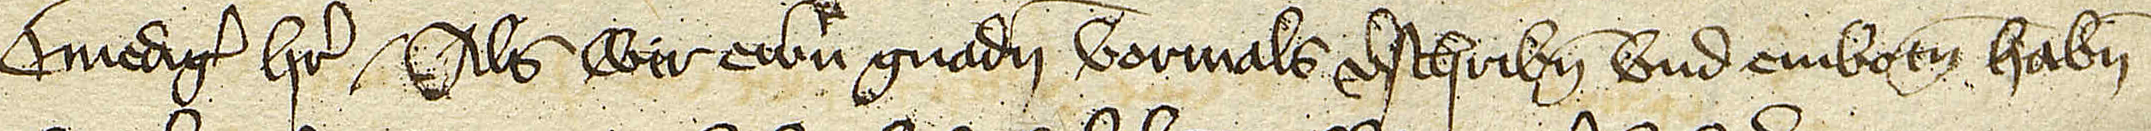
Gnedig* hr* / Als wir ew*n gnadn* vormals v*ſchribn* vnd embotn* habn*
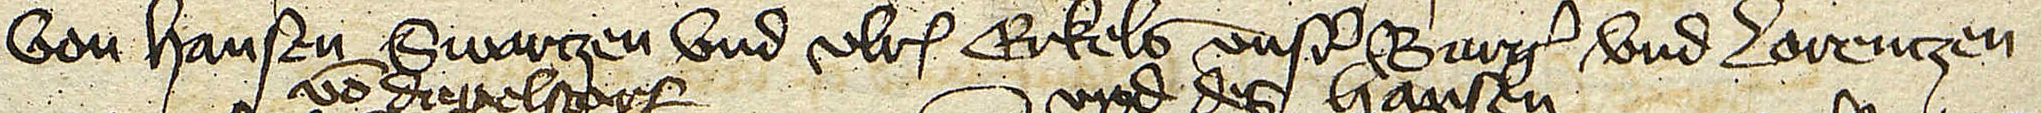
von hanſen Swarcʒen vnd vlr* Erkels vnſr* Burg* / vnd Lorencʒen
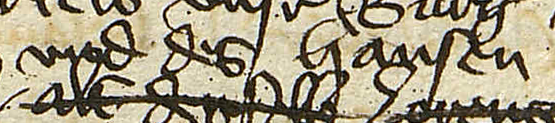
vnd des hanſen
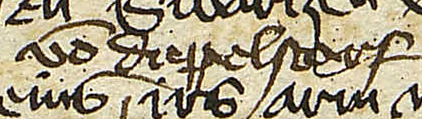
vo* dieppelſtorf
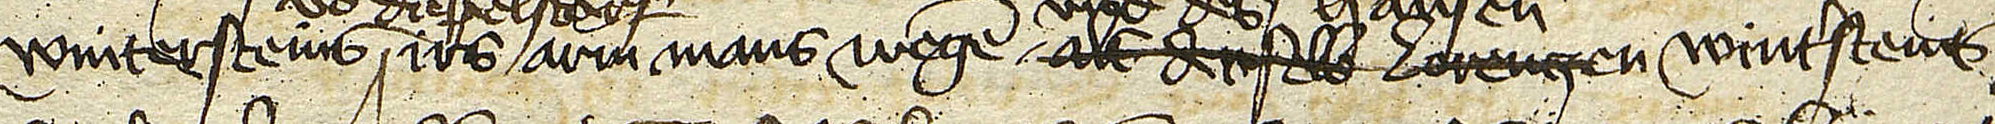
winterſteins irs arm mans wege* als denſelb Lorencʒen wint*ſteins
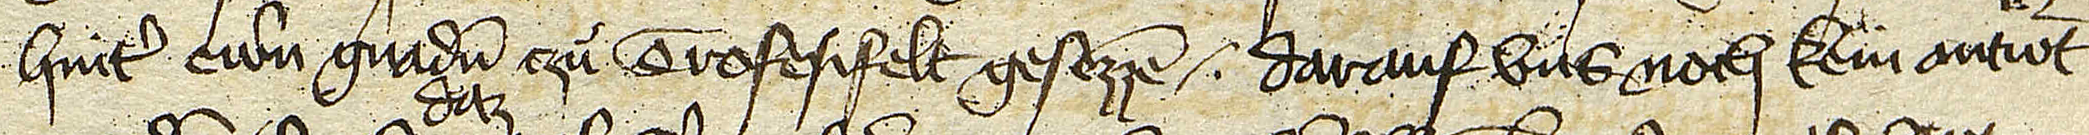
hint* ew*n gnadn* cʒü Trofenfelt geſeʒʒe* / . darauf vns noch kein antw*t
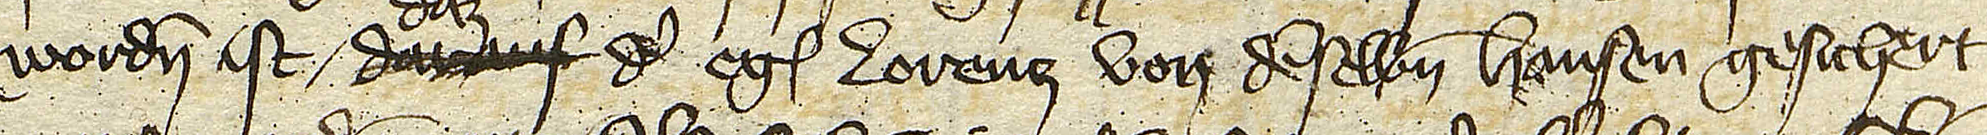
wordn* iſt / darauf d* eg* Lorencʒ von d* ſelbn* hanſen geſichert
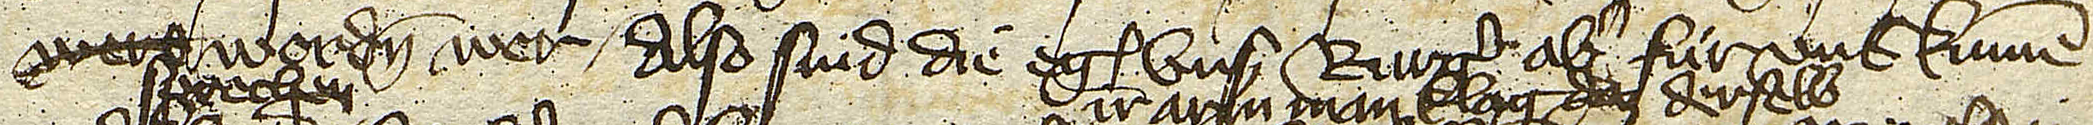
wer wordn* wer / Alſo ſind die eg* vnſ* Burg* ab* für vns kume*
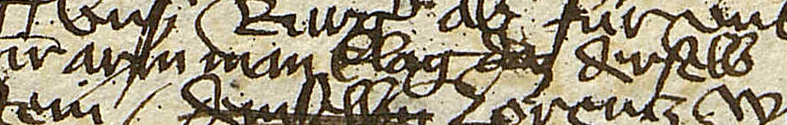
ir arm man klag daʒ derſelb
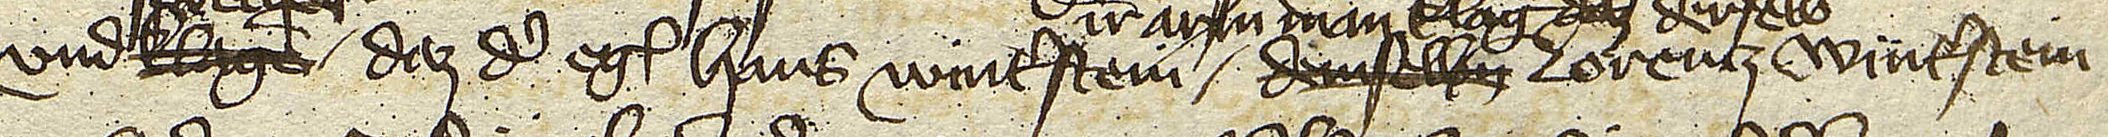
vnd klage* / daʒ d* eg* hans wint*ſtein / demſelbn* Lorencʒ wint*ſtein
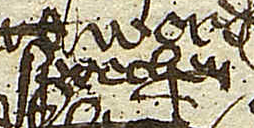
ſprechen
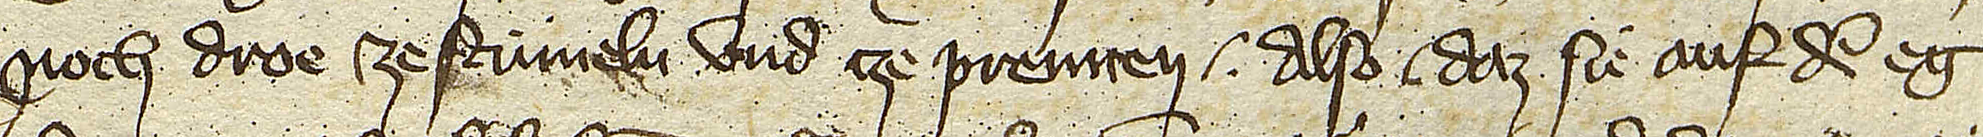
noch droe cʒeſtümeln vnd cʒe prennen / . Alſo / daʒ ſie auf d* eg*
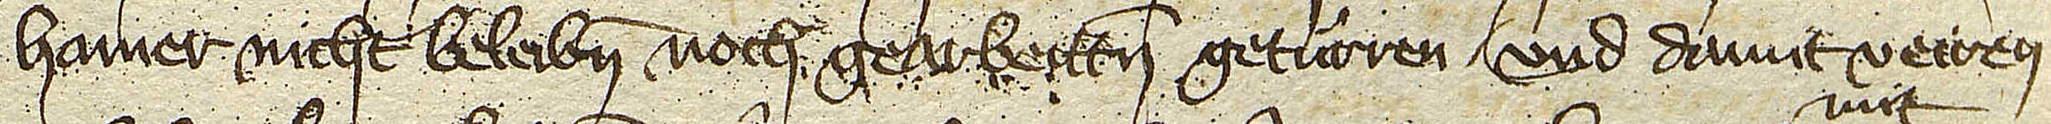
hamer nicht beleibn* noch gearbeitn* getürren / vnd damit varen
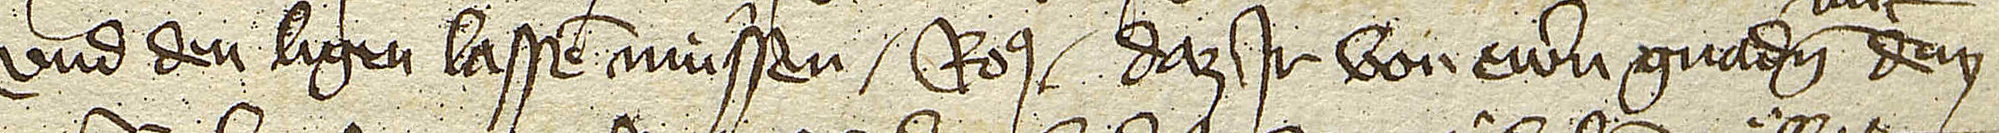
vnd den ligen laſſe* müſſen / Ro* / daʒ Ir von ew*n gnadn* dem
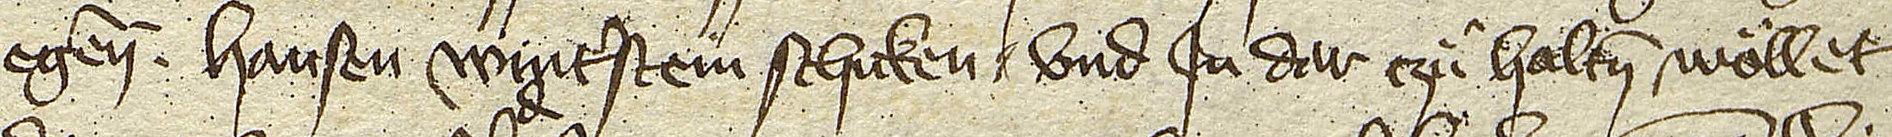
egen*. hanſen wint*ſtein ſchicken / vnd In dar cʒü haltn* wöllet
